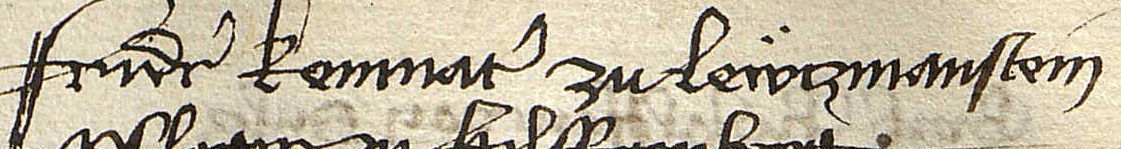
Fridr* Kemnat* ʒu Lewcʒmanſtein
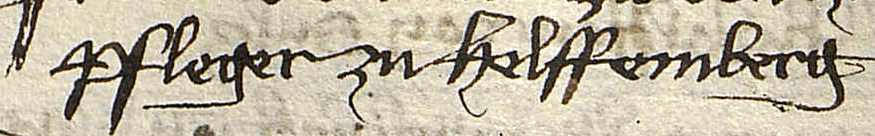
Pfleger ʒu Helffemberg
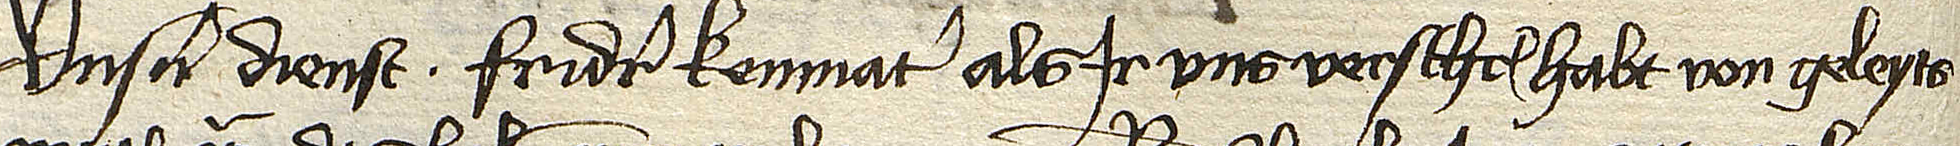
Vnſn* dienſt . Fridr* Kemnat* als Ir vns verſchr* habt von geleyts
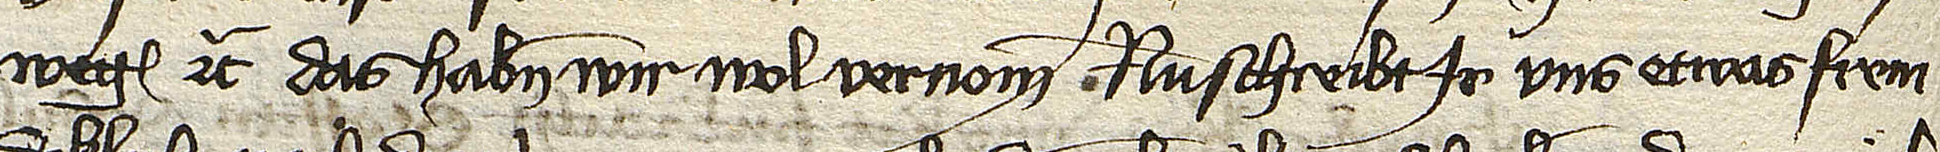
weg* ec* das habn* wir wol vernom* Nu ſchreibt Ir vns etwas frem
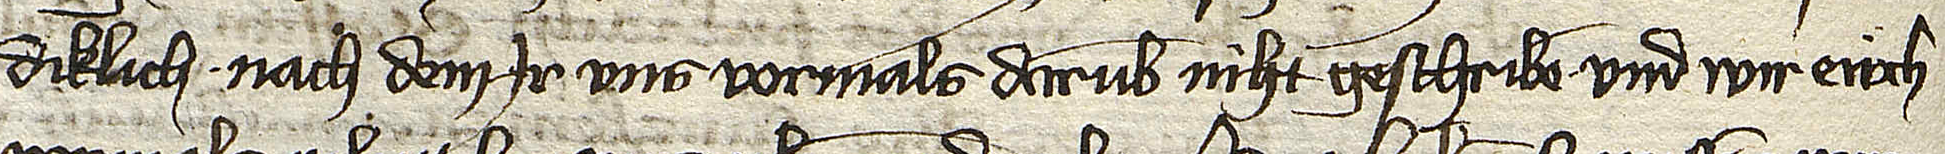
diklich . nach dem Ir vns vormals darub* niht geſchribe* . vnd wir ewch
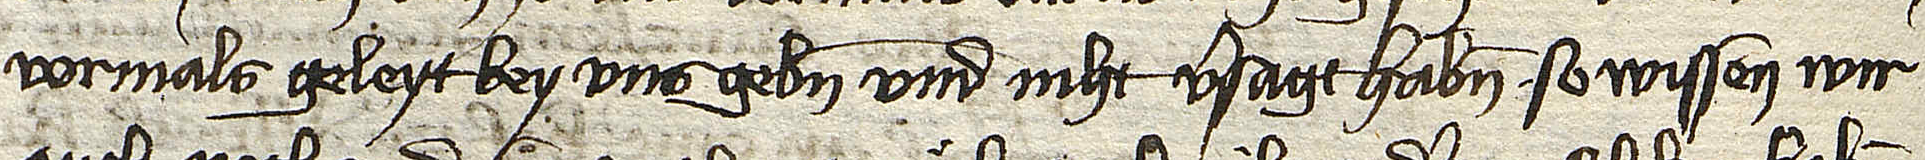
vormals geleyt bey vns gebn* vnd niht v*ſagt habn* . ſo wiſſen wir
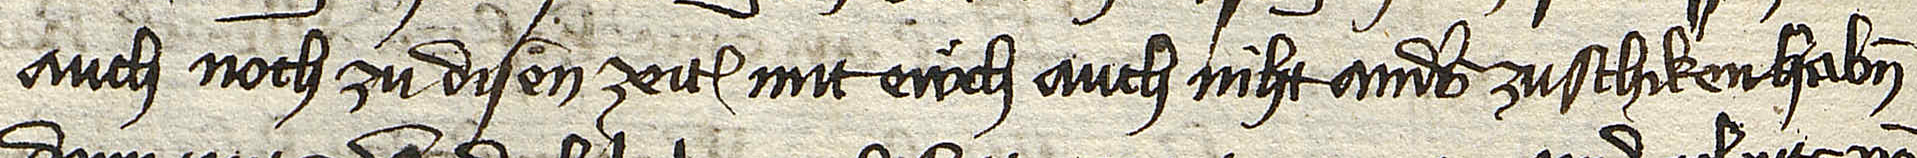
auch noch ʒu diſen ʒeit* mit ewch auch niht and*s ʒuſchiken habn*
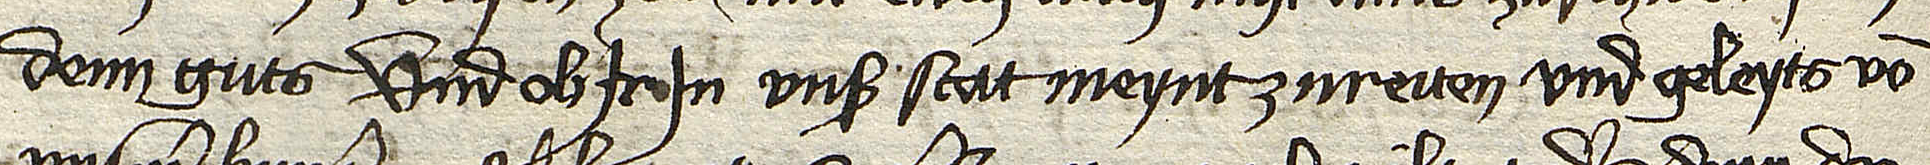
denn guts Vnd ob Ir In vnſ* ſtat meynt ʒureiten vnd geleyts vo*
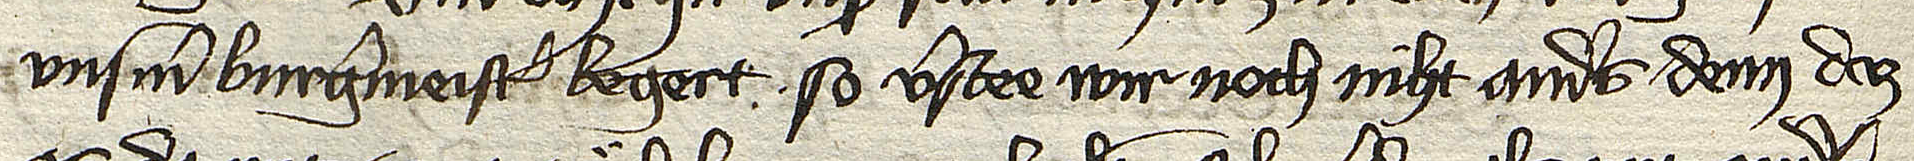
vnſm* burg*meiſt* begert . ſo v*ſtee wir noch niht ands* / denn daʒ
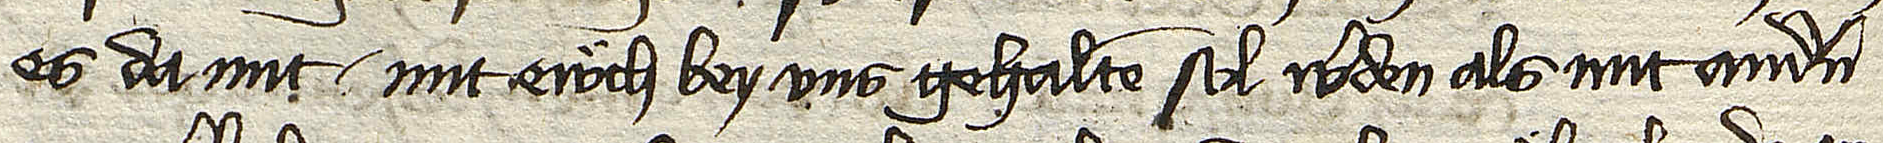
es da mit / mit ewch bey vns gehalte* ſol w*den als mit andn*
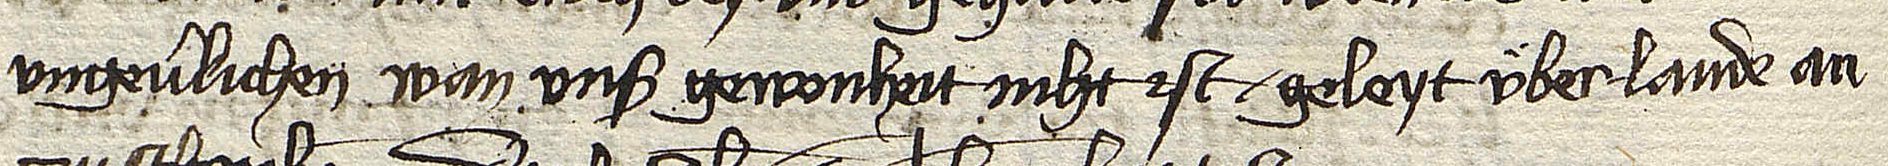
vngeu*lichen wan vnſ* gewonheit niht iſt / geleyt v̈ber lande an
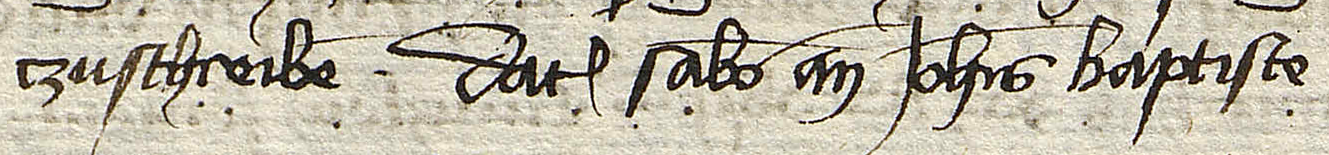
cʒuſchreibe* . Dat* ſabo* an* Iohis* baptiſte
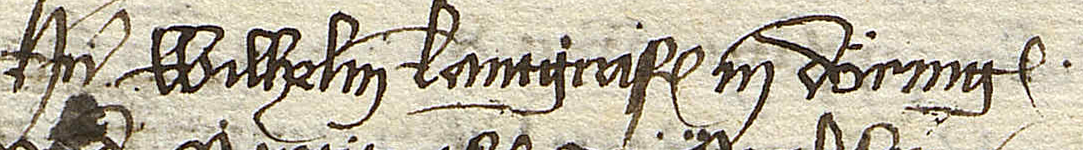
Hn* Wilhelm* lantgraf* in Döring*
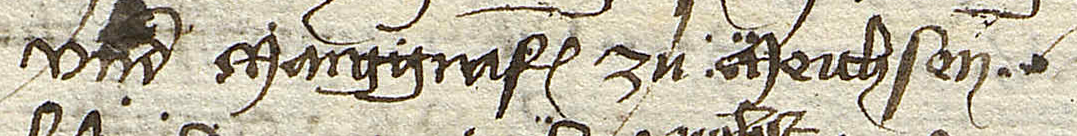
vnd Marggraf* ʒu Meichſen /
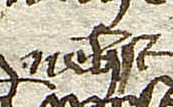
nehſt
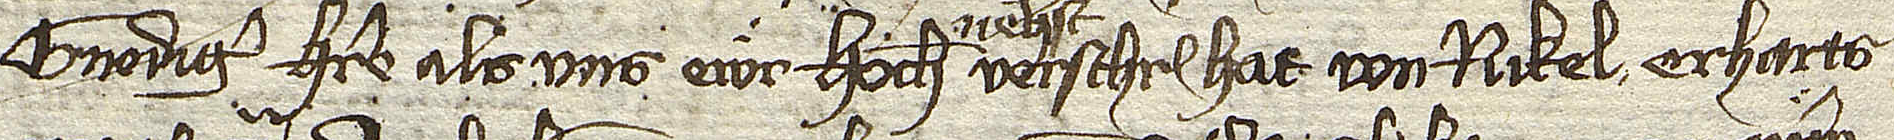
Gnedig* hr*e als vns ewr Hoch* verſchr* hat von Nikel erharts
